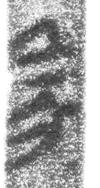義
